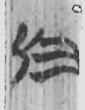於
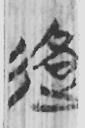{辶各}
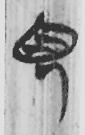見
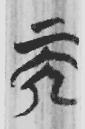而
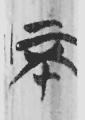不
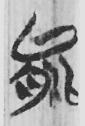能
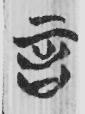言
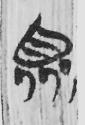眾
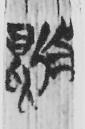{於鳥}（烏）
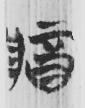𨟻（將）
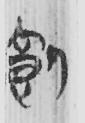飤
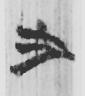之
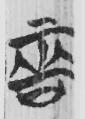{巫口}
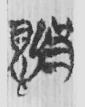{於鳥}（烏）
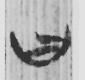曰
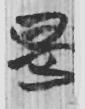是
